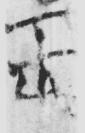{工心}
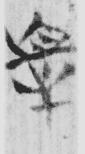辠
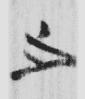之
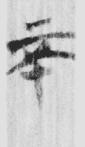不
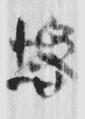{土夬口}
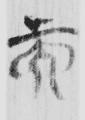而
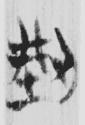型
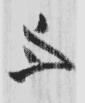之
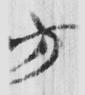方
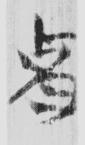肙
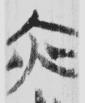亦
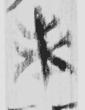未
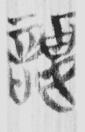{言妻}
